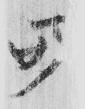名
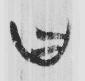曰
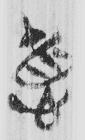惪
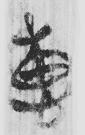惠
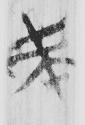民
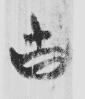由
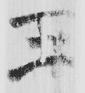壬
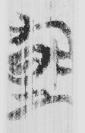{土旬}
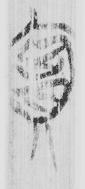{宀句貝}
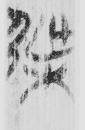傑
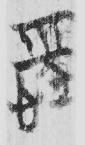{心㸒}
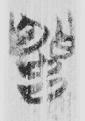{門串}
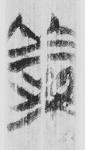義
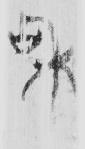和
